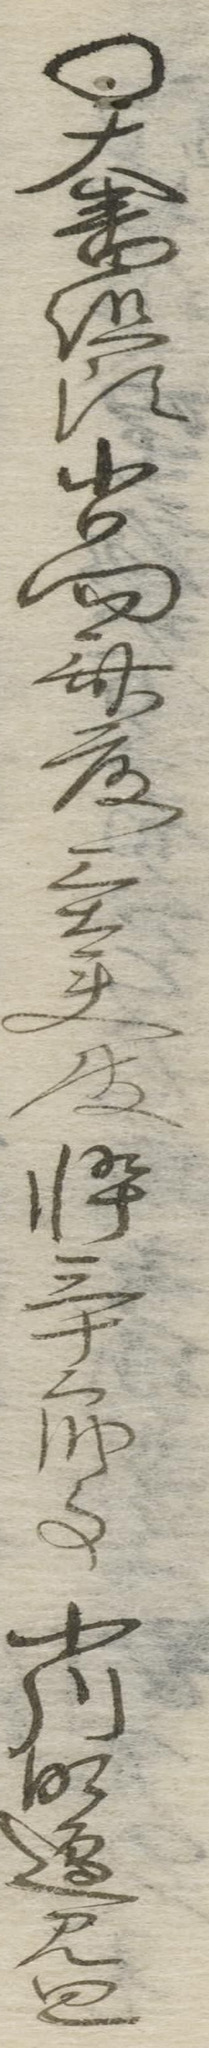○大番組頭小日向斎藤三太夫殿悴三十郎事小川町辺見廻
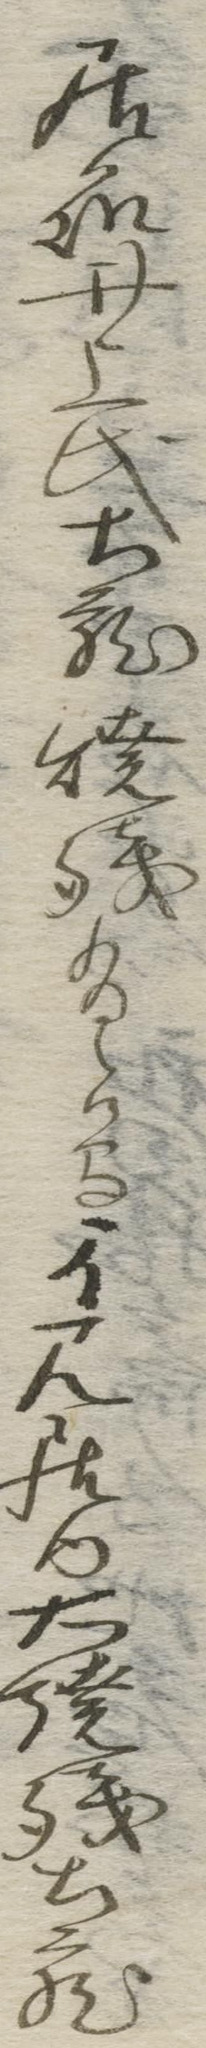居候処井上氏土蔵焼残有之候間佇見居内右焼残土蔵
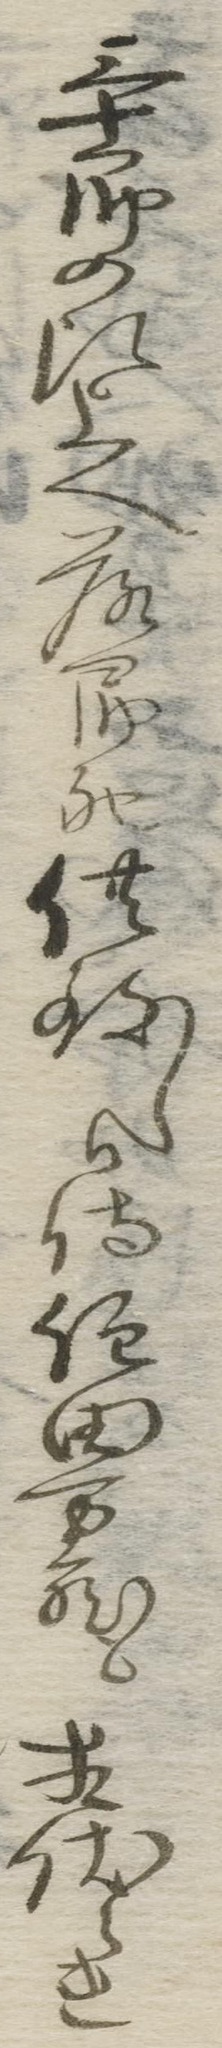三十郎の頭上へ落即死供致し候侍住田万蔵も相伏られ
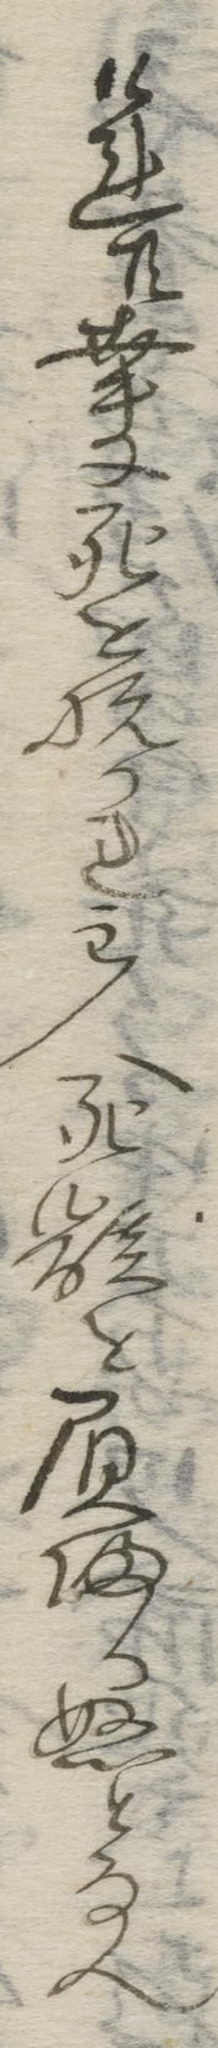けれ共幸に死を脱かれ主人死骸を負帰りぬとなん
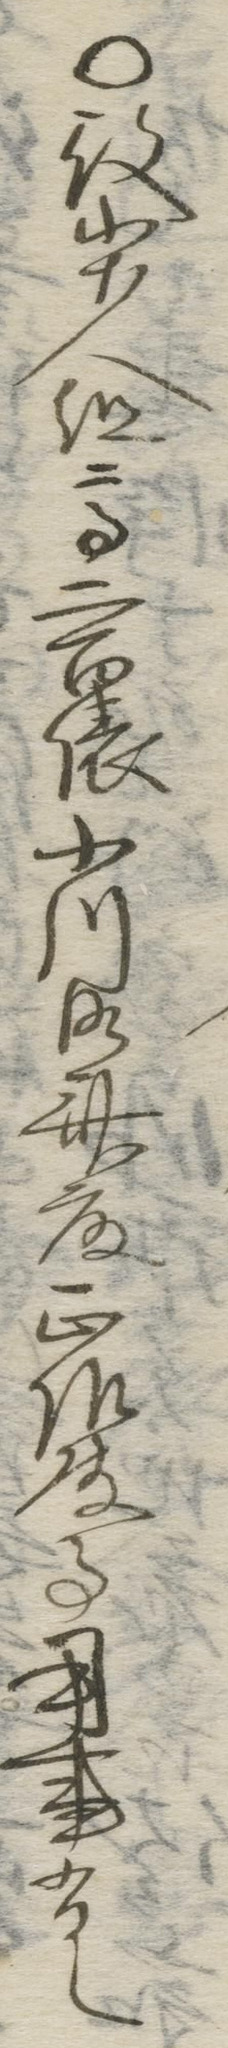○役弐十人組高二百俵小川町斎藤正作殿事用事有之
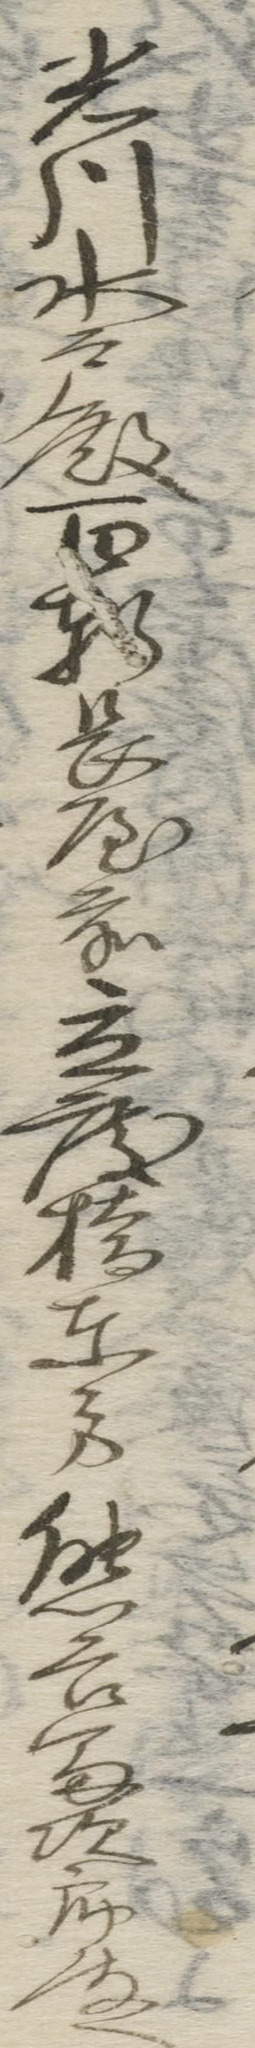小石川水戸殿百軒長屋前立度橋東方熊谷富次郎殿へ
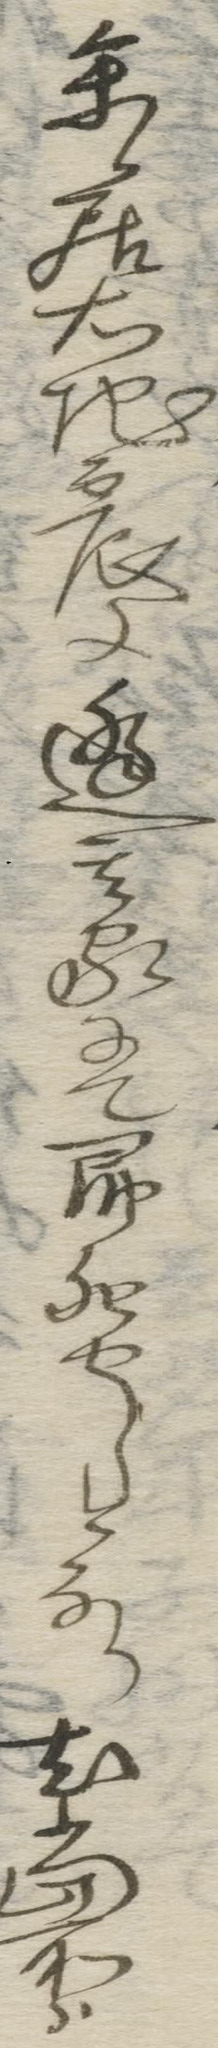参り居右地震に逢其家にて即死せしとなり尤当所ら
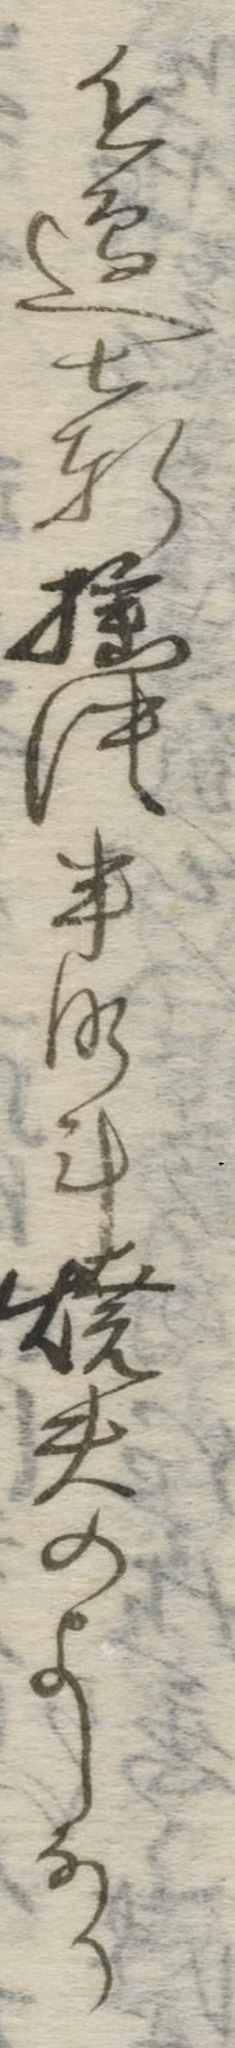近邊七軒揺潰半町斗焼失のよしなり
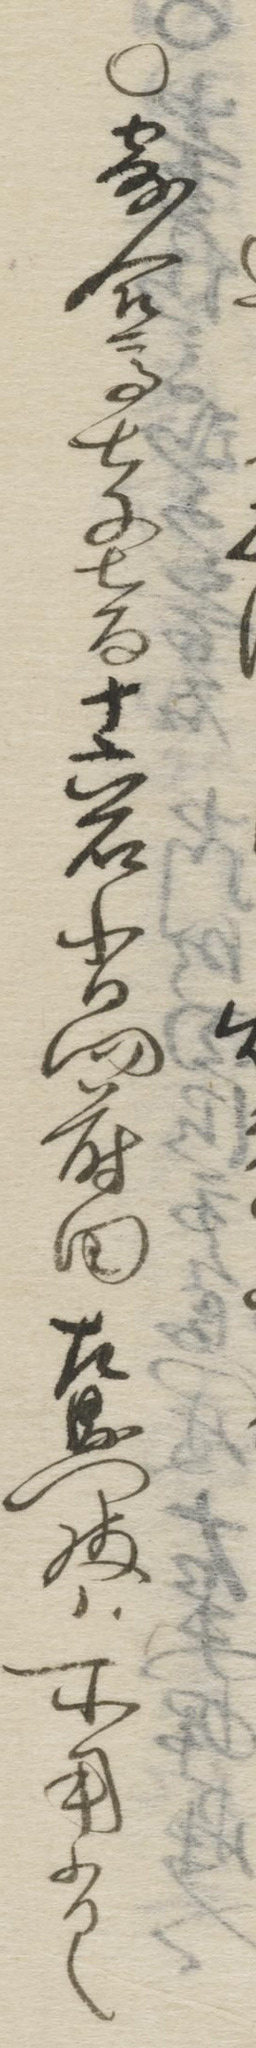○寄合高七千七百十六石小日向蒔田左衛門殿ハ所用有之
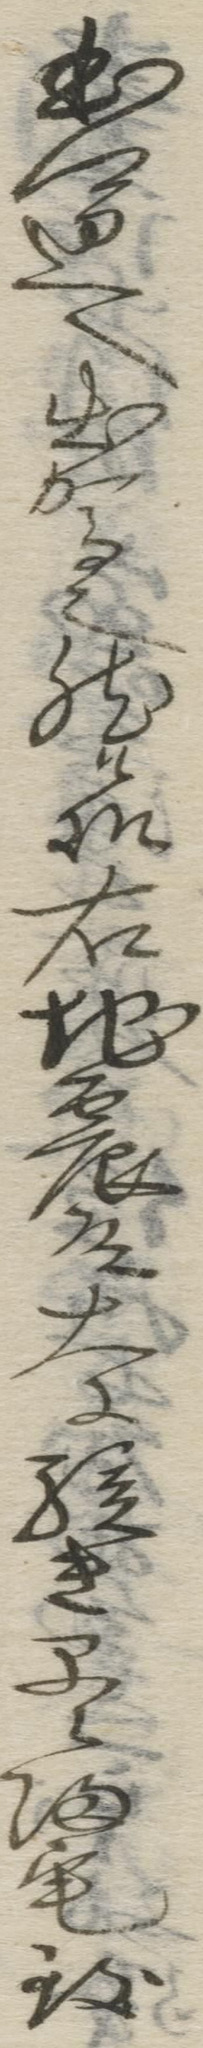本郷辺へ出駕也然ル処右地震故大に駭き早々帰宅致
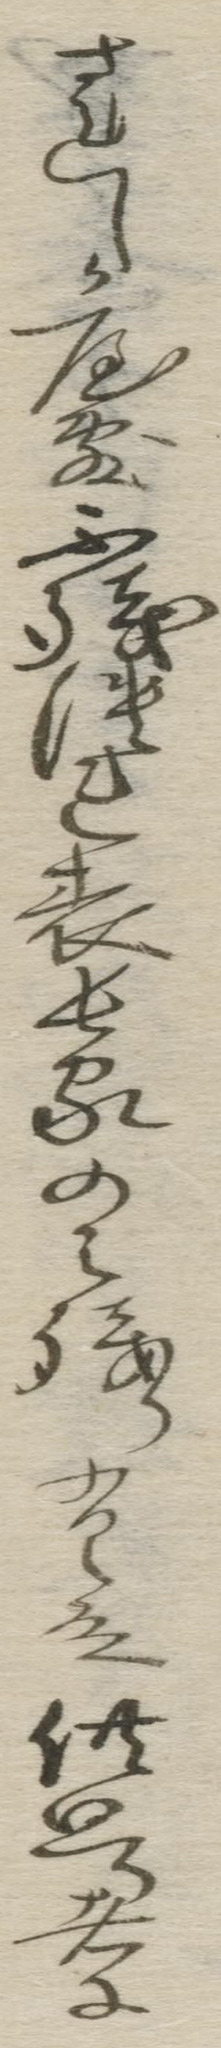されしか屋敷不残潰表長家のみ残り有之故供廻り者に
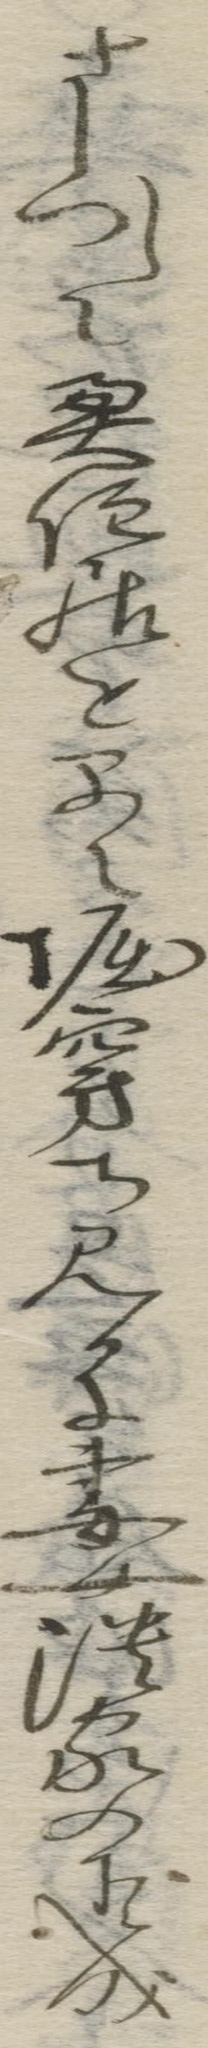さしつして奥住居を早々堀穿ち見るに妻女潰家の下に成
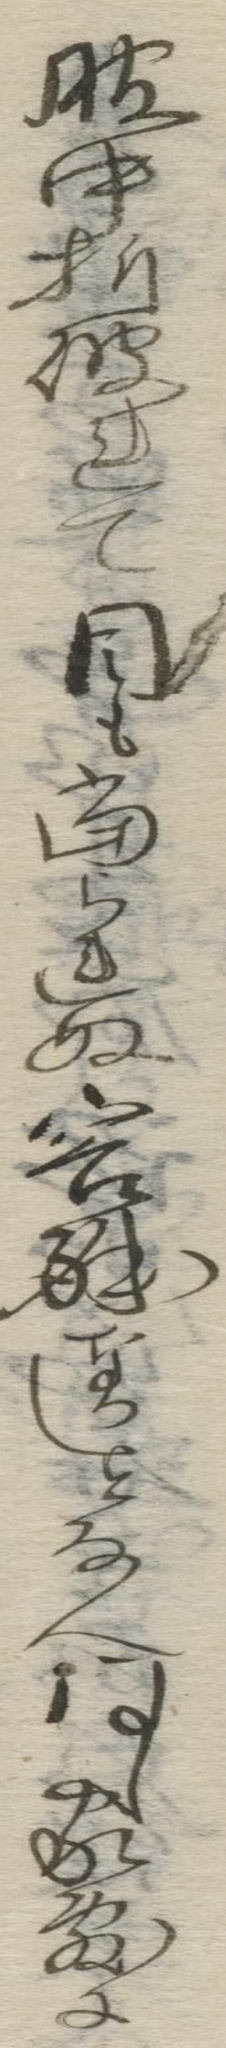服中折破れて目も当られぬ容体なりしとなん同し家敷に
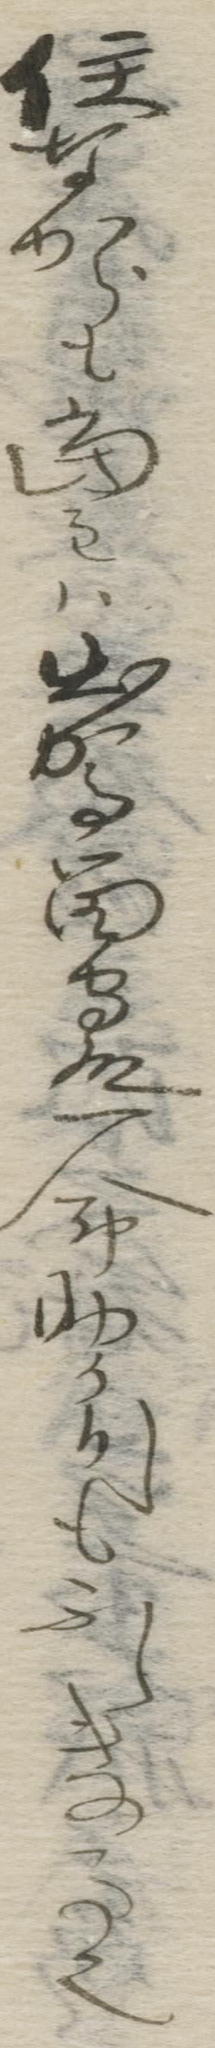住なからも当主は出駕留守故一命助かりしもふしきの事也
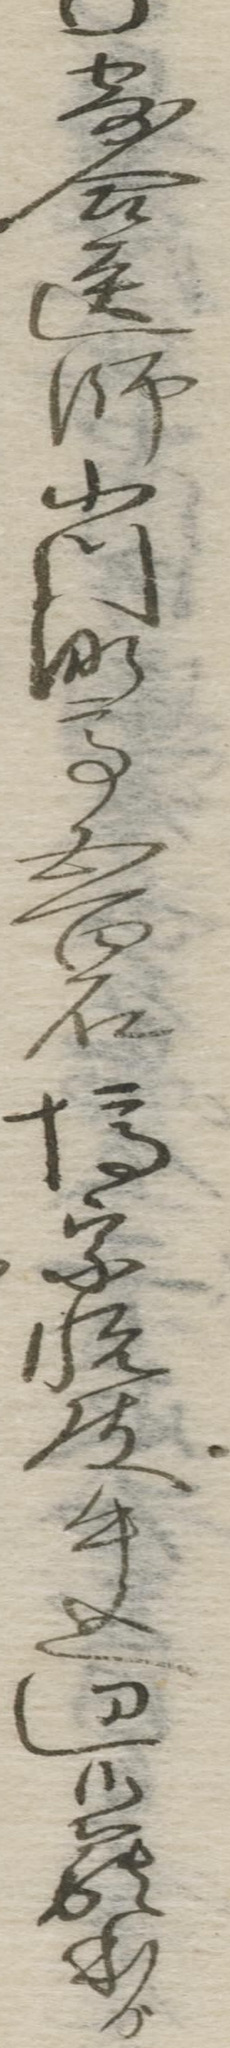○寄合医師小川町高五百石塙宗悦殿牛込辺御旗本ゟ
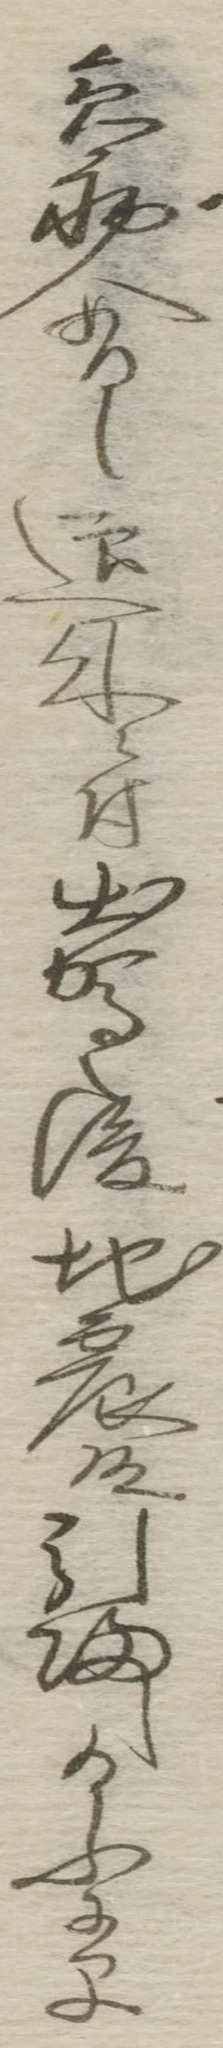急病人有之迎来ニ付出駕之後地震故引帰し給ふに早
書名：江戸中諸屋敷　地震竒談録
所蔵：東京大学地震研究所図書室 Earthquake Research Institute Library, The University of Tokyo, JAPAN
